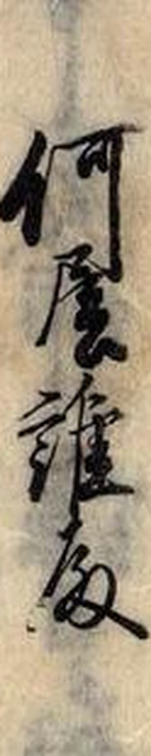何屋誰殿
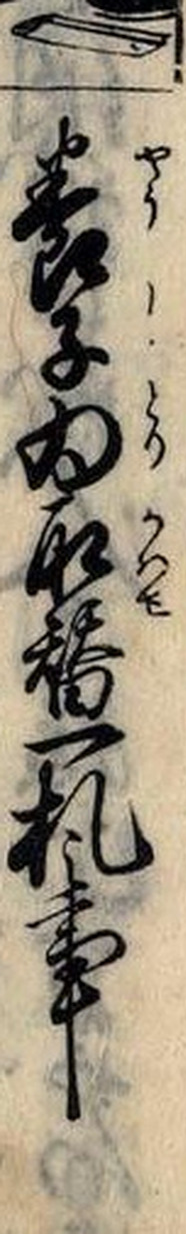養子為取替一札之事
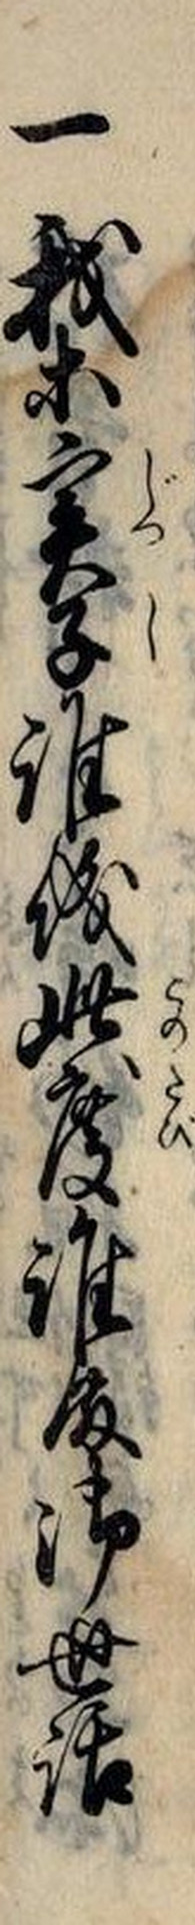一我等実子誰儀此度誰殿御世話
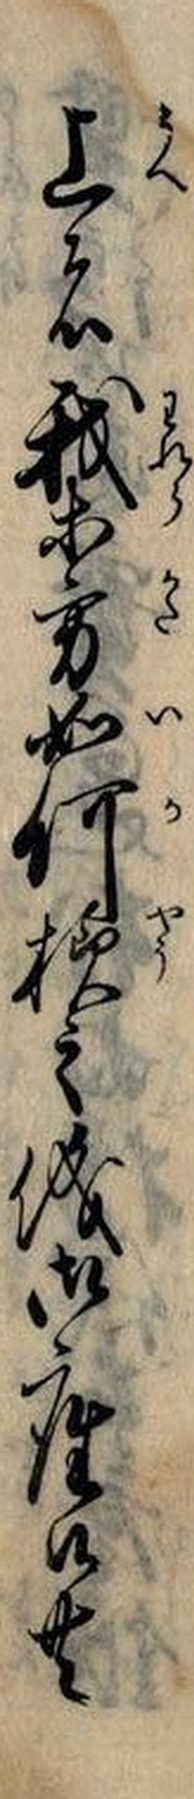上者我等方如何様之儀御座候共
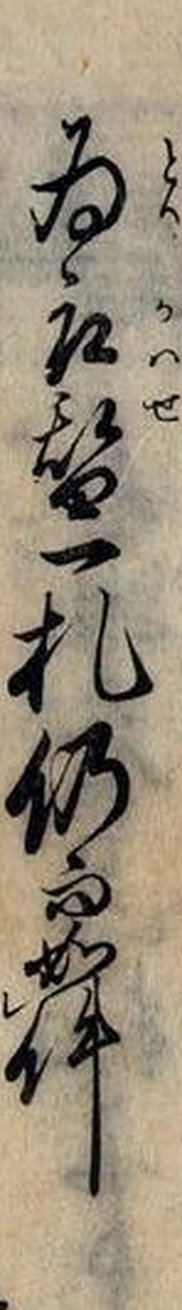為取替一札仍而如件
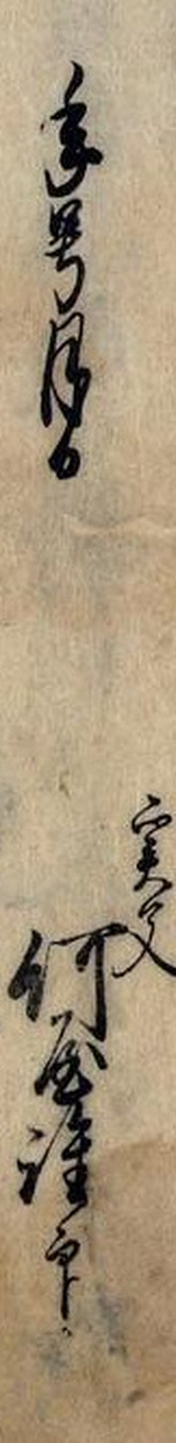年号月日何屋誰印
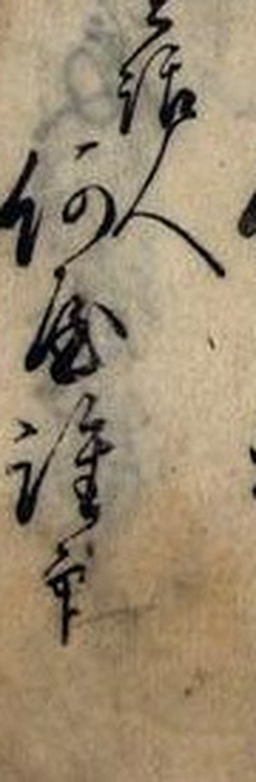何屋誰印

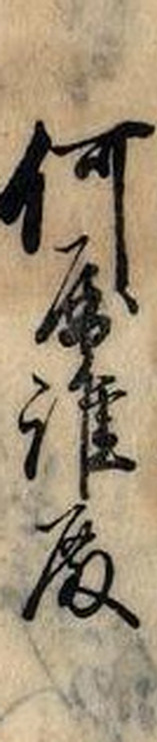何屋誰殿
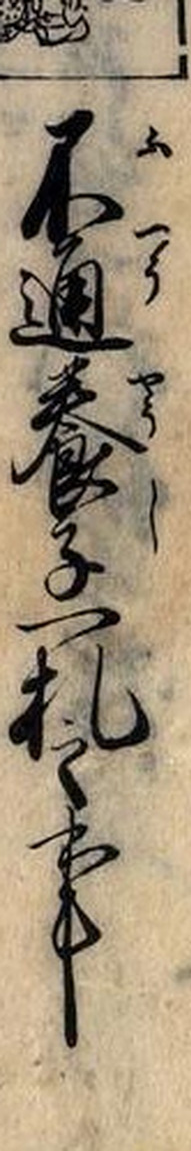不通養子一札之事
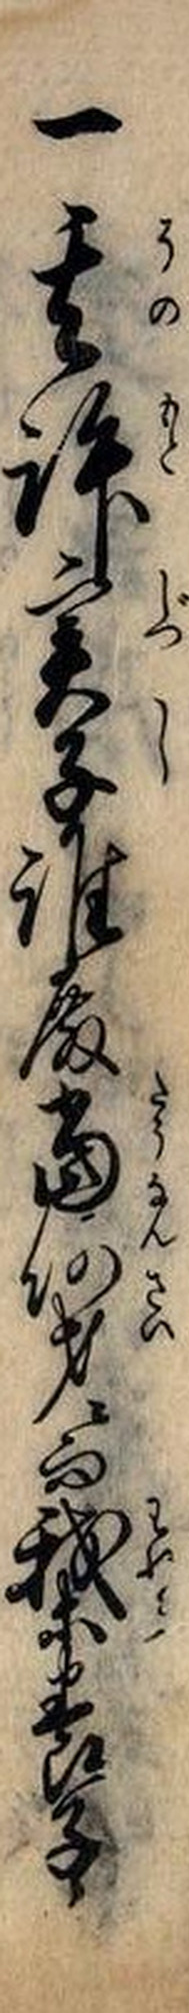一其許実子誰殿當何才に而我等養子
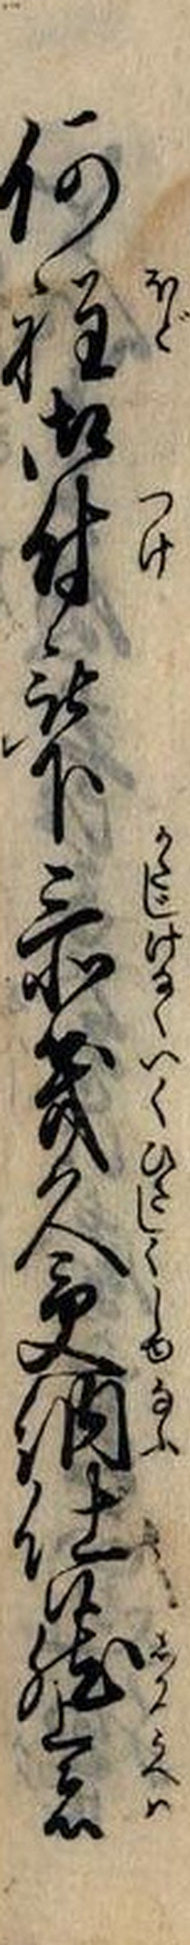何程御付被下忝幾久受納仕候然上者
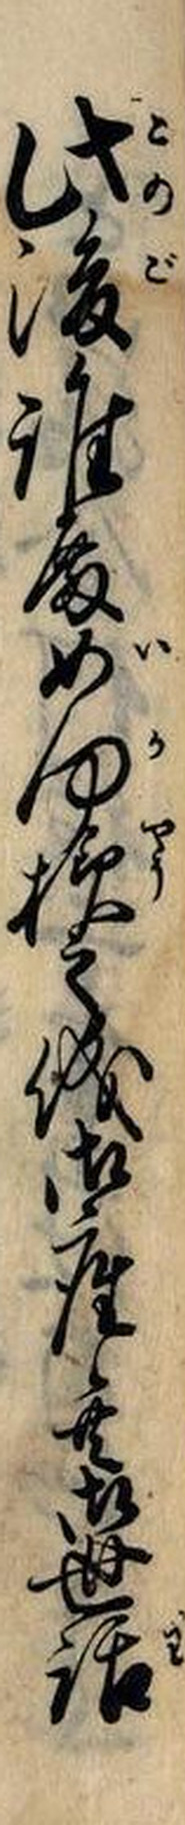此後誰殿如何様之儀御座候共御世話
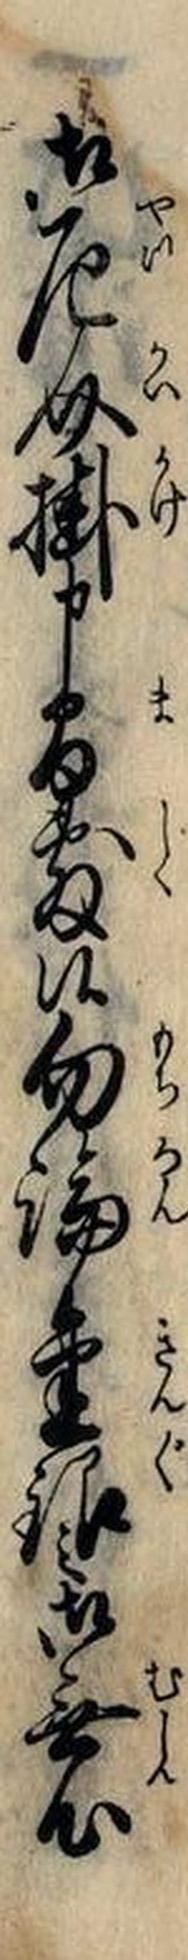御厄介掛申間敷候勿論金銀之御無心
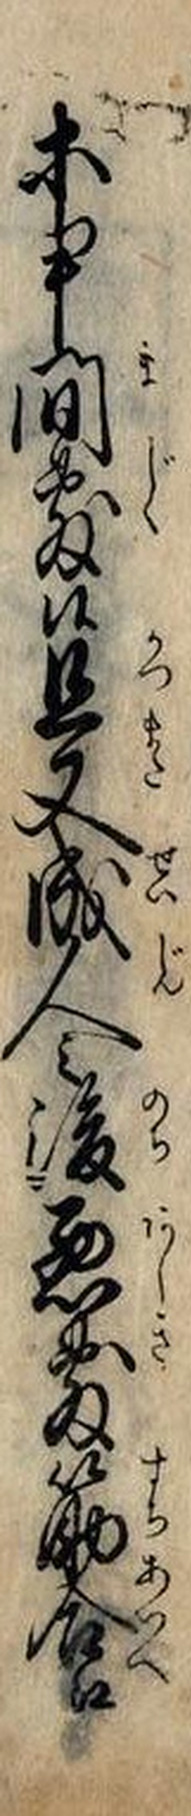等申間敷候且又成人之後悪敷筋合江
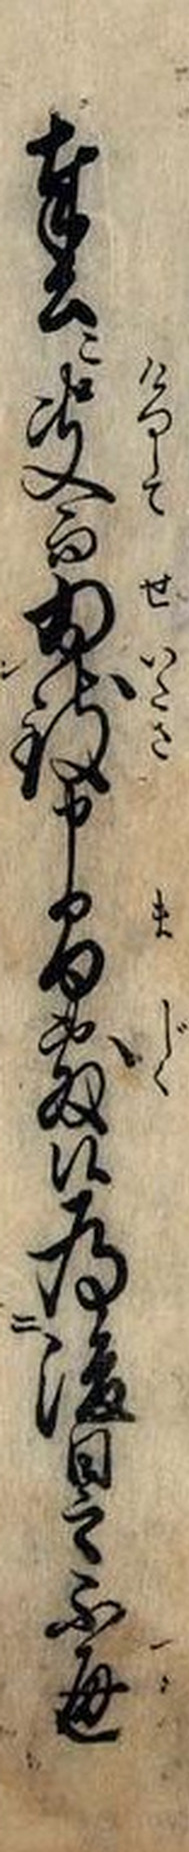奉公に決而為致申間敷候為後日之不通
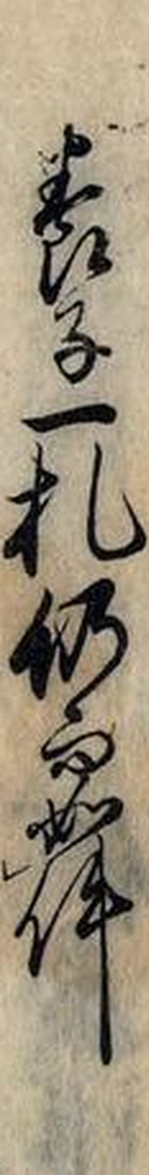養子一札仍而如件
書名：大成用文章（往来物）
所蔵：福井県文書館 Fukui Prefectural Archives
